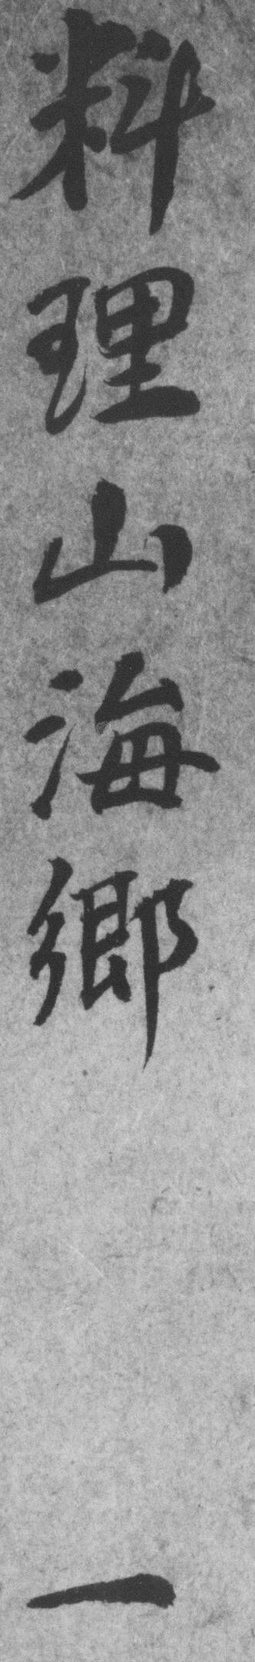料理山海郷一

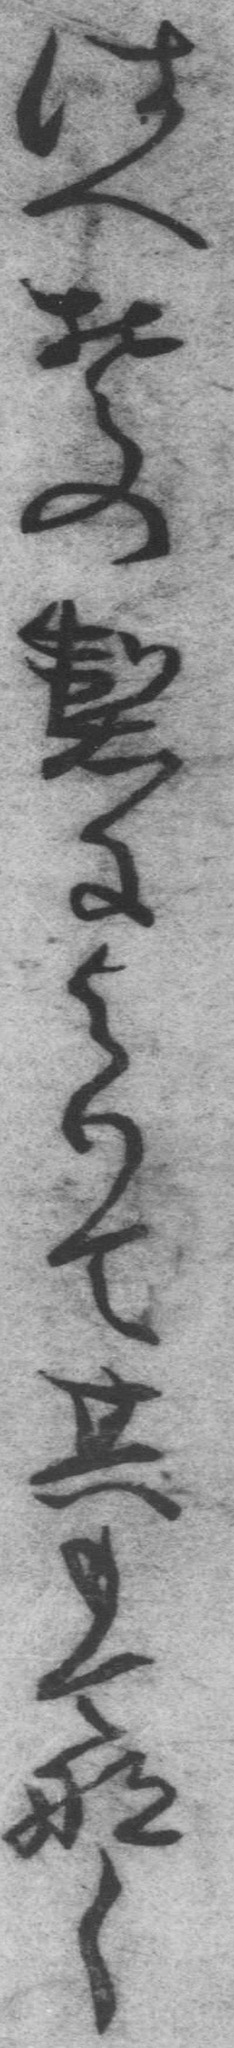さへその製によりて其もてなし
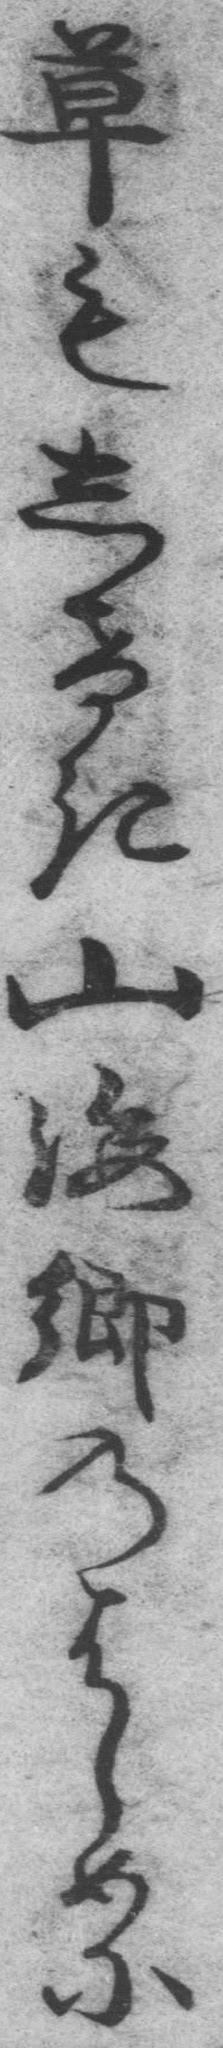草もしけき山海郷のはしめに
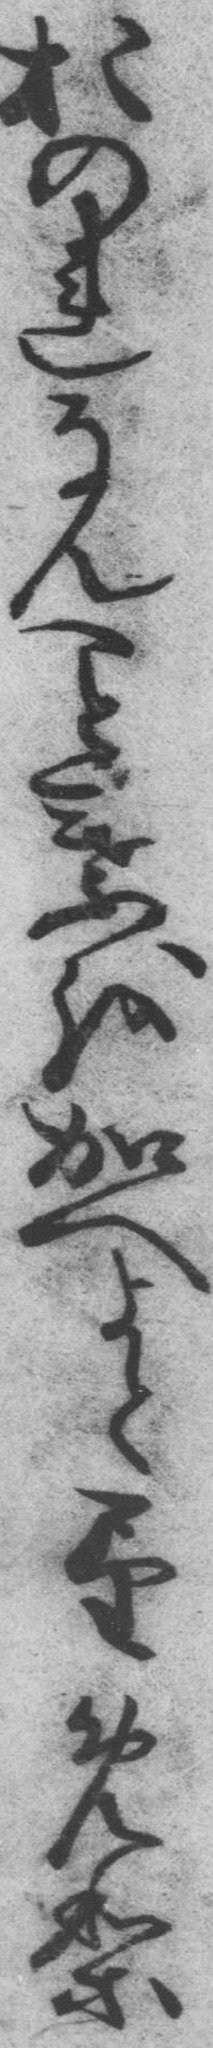おのれなんこと葉を加へよと望めり
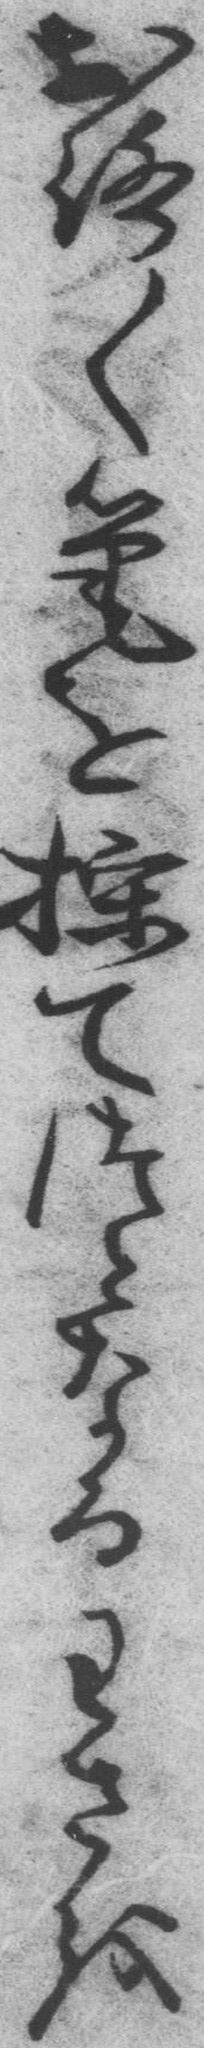おろ〳〵筆を採てつとなるわさを
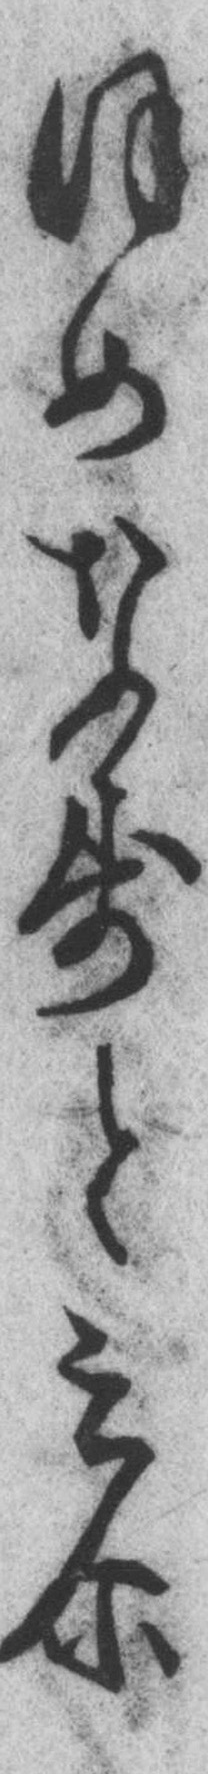ほめなふ歩と云に
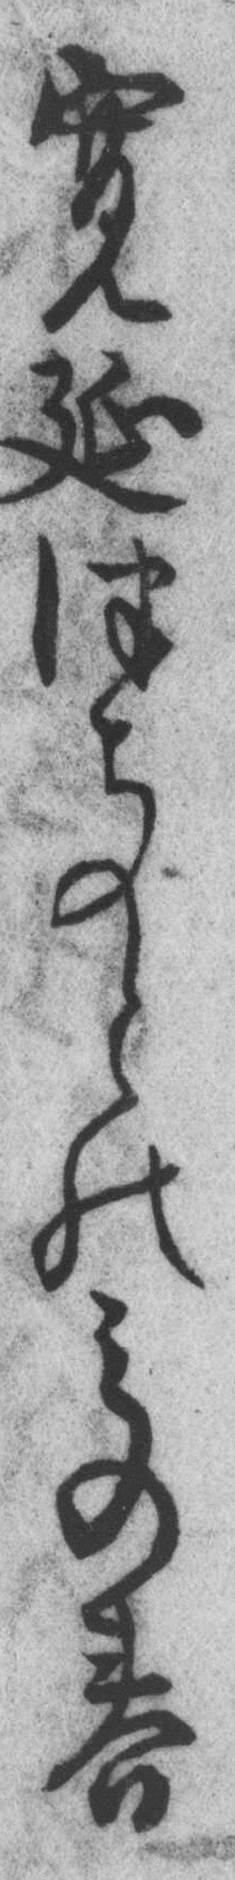寛延つちのとのみの春
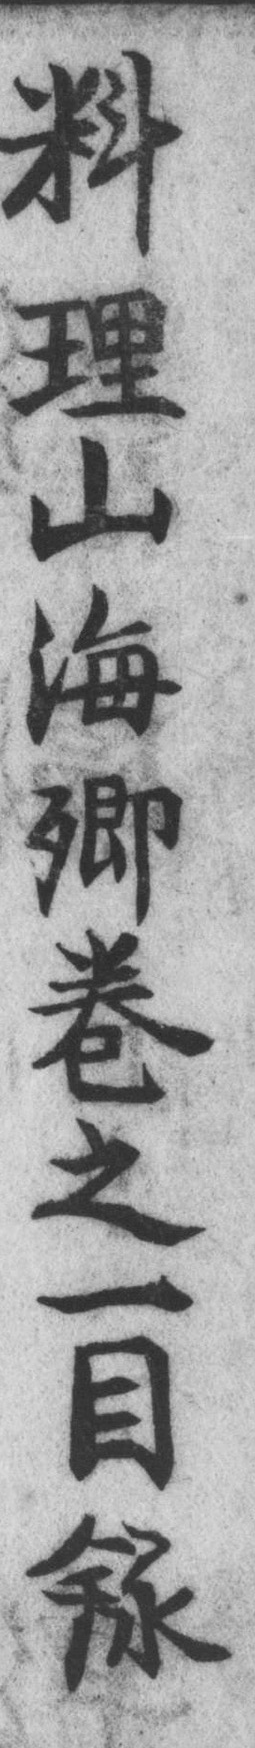料理山海郷巻之一目録

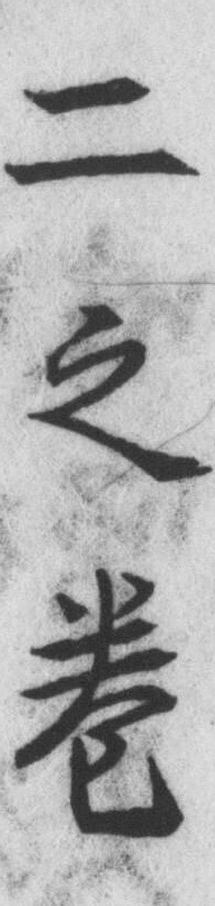二之巻

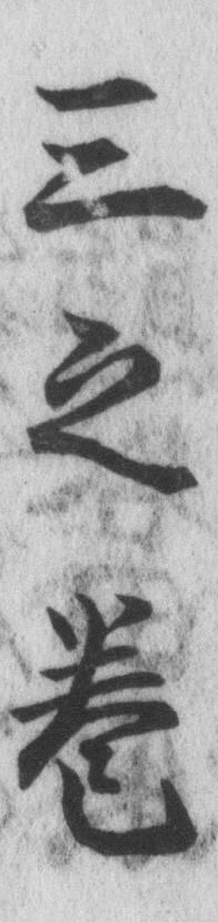三之巻

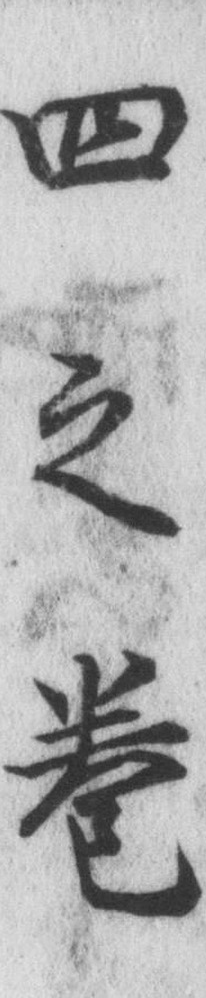四之巻

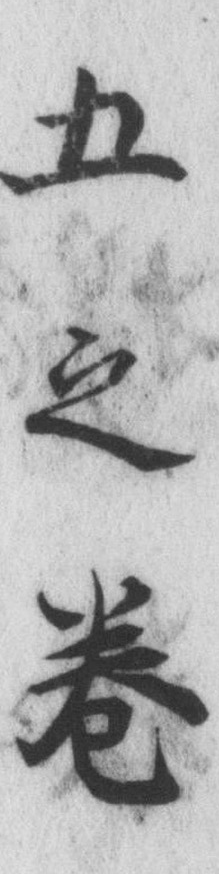五之巻

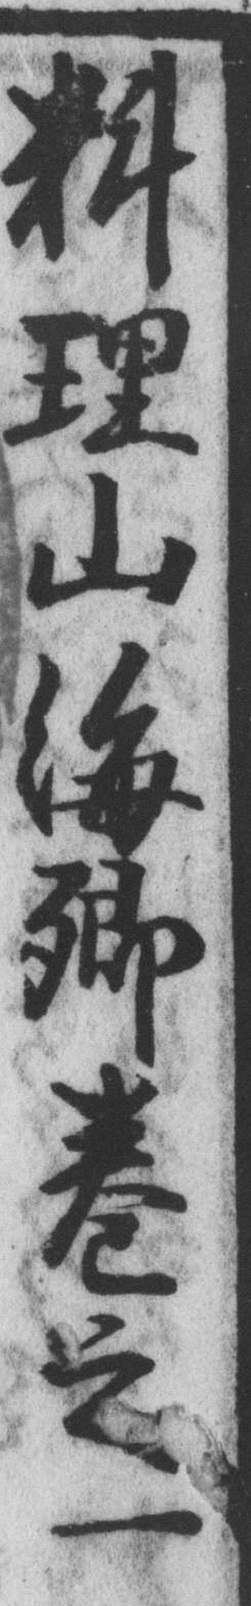料理山海郷巻之一
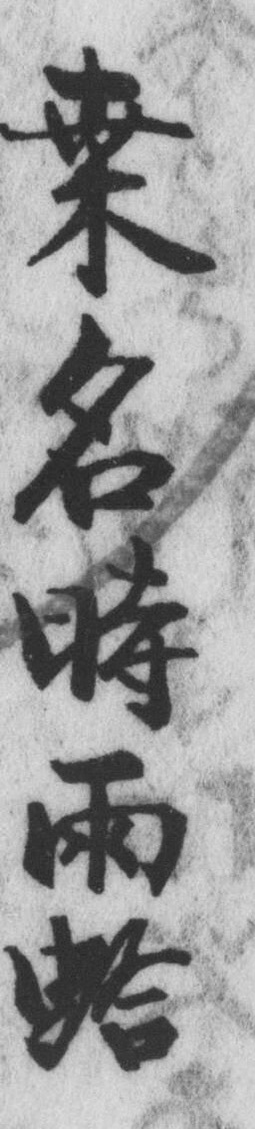桑名時雨蛤
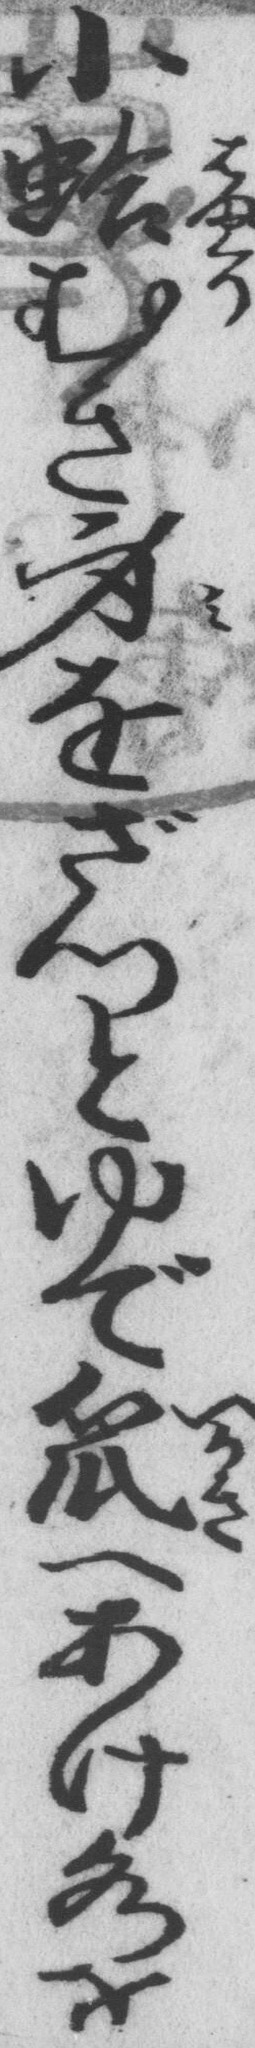小蛤むき身をざつとゆで笊へあけ水を
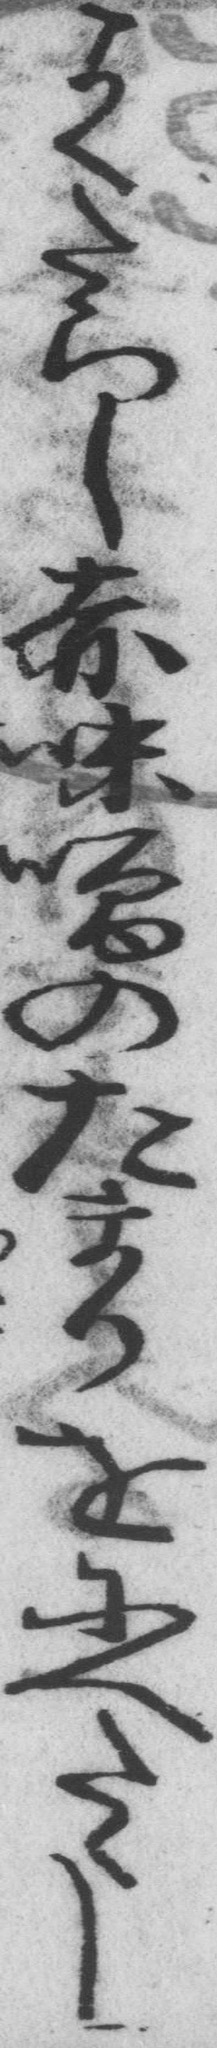よくたらし赤味噌のたまりをにへたゝし
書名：料理山海郷
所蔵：大阪府立大学学術情報センター 国文学研究資料館
